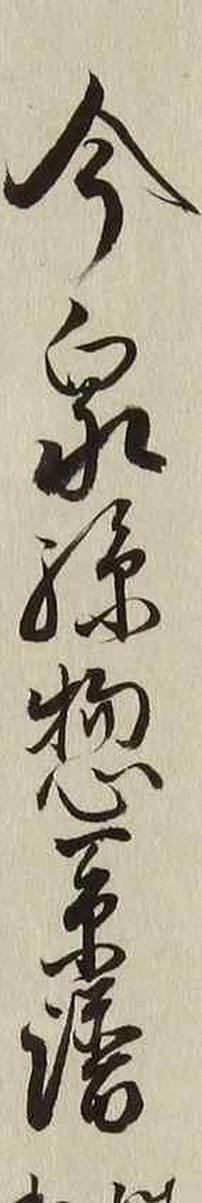今泉孫惣系譜
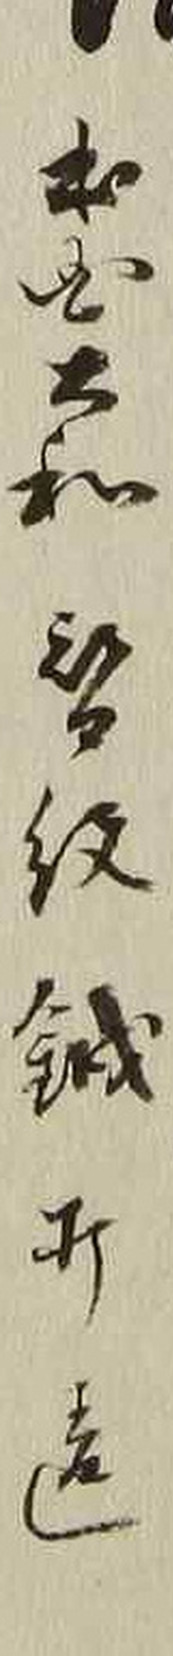本国大和替紋鉞打違
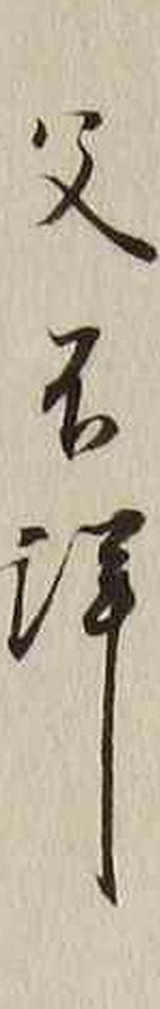父不詳
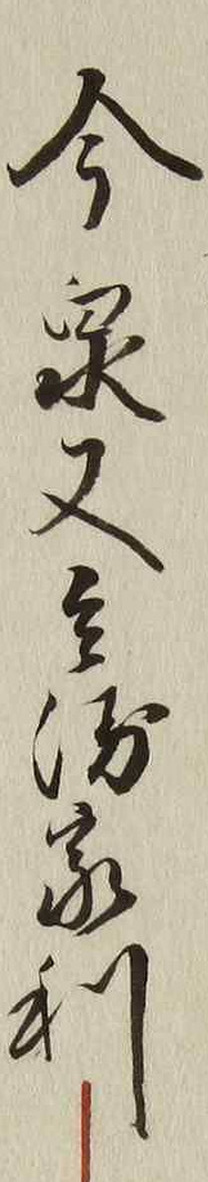今泉又兵衛家利
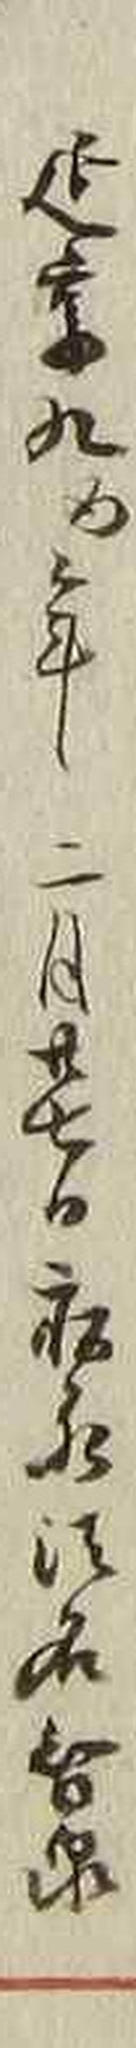延享九酉年二月廿七日病死法名智泉
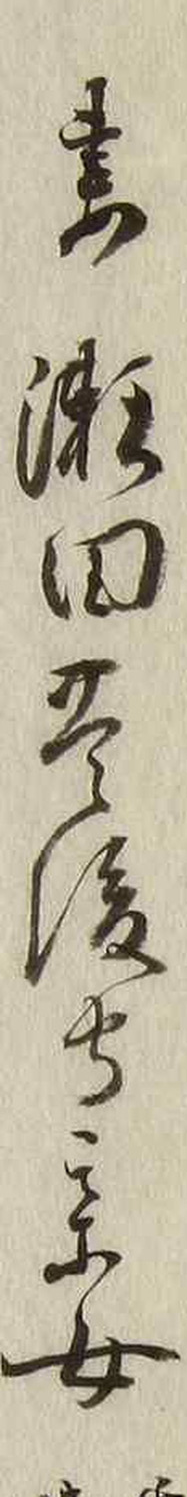妻瀬田豊後守某女
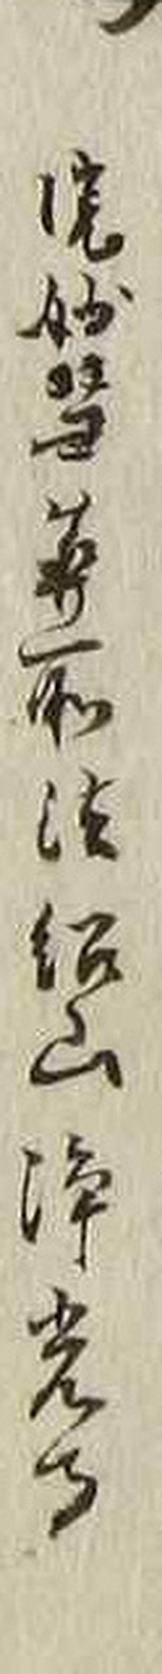院妙彗葬所法紹山浄光寺
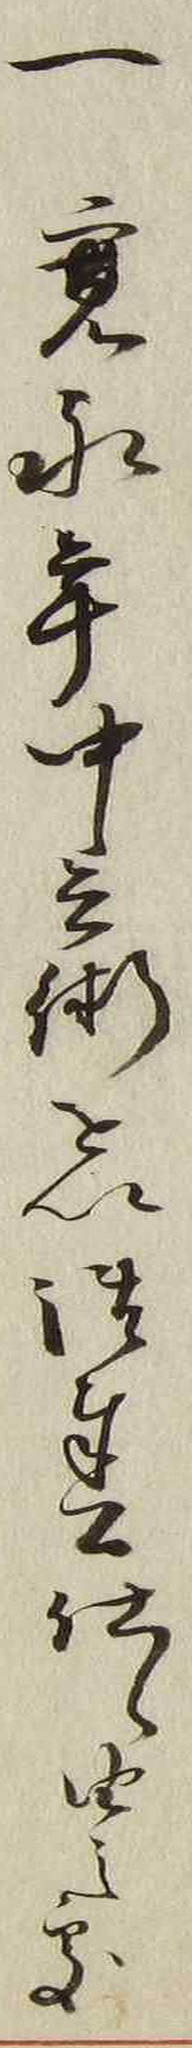一寛永年中兵術を以て御奉公仕り候由之処
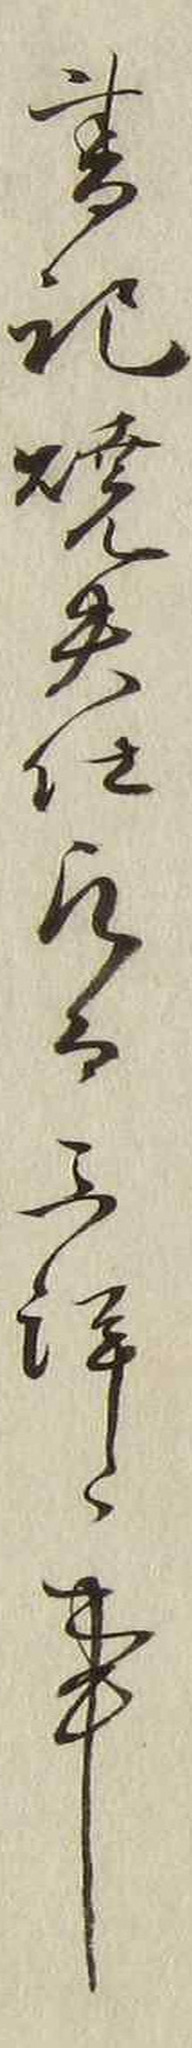書記焼失仕り候て不詳候事

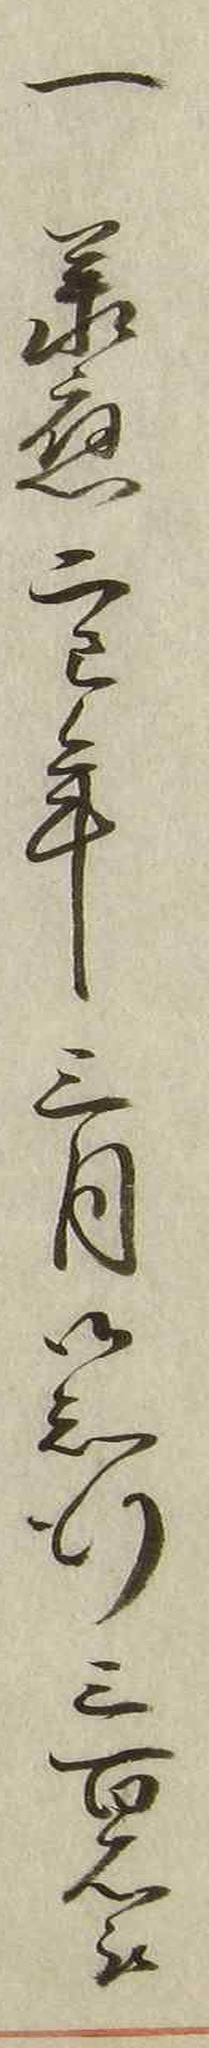一承応二巳年三月御知行三百石
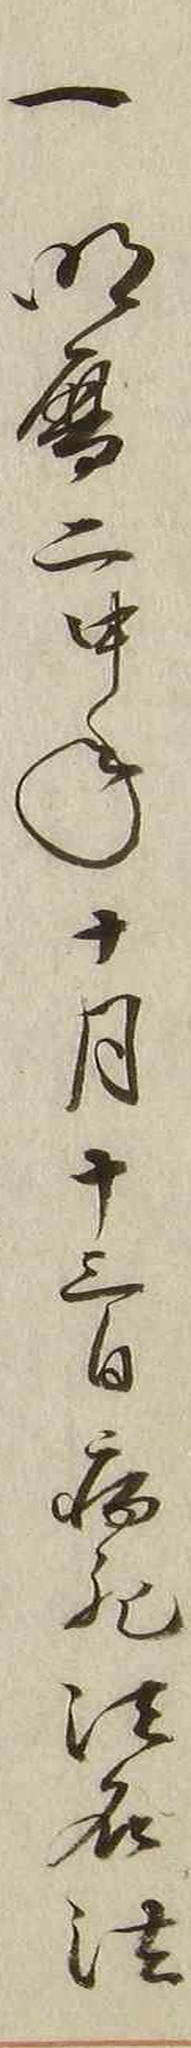一明暦二申年十月十三日病死法名法
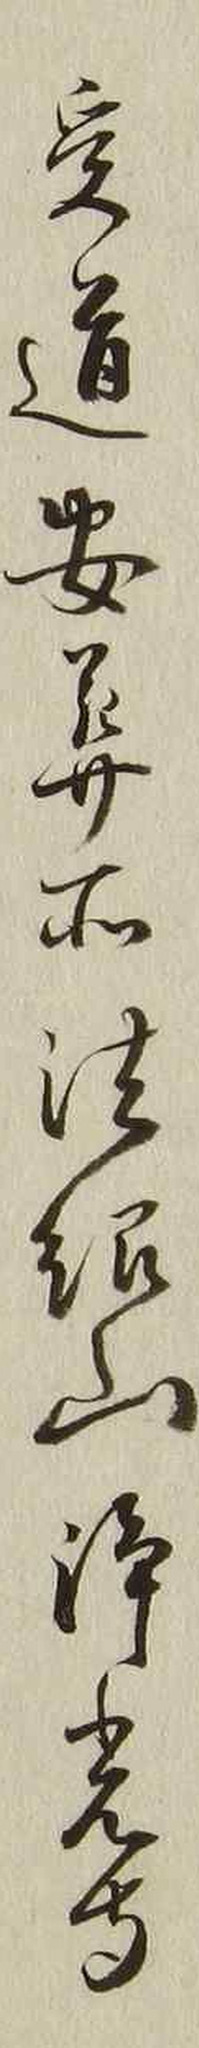受道安葬所法紹山浄光寺
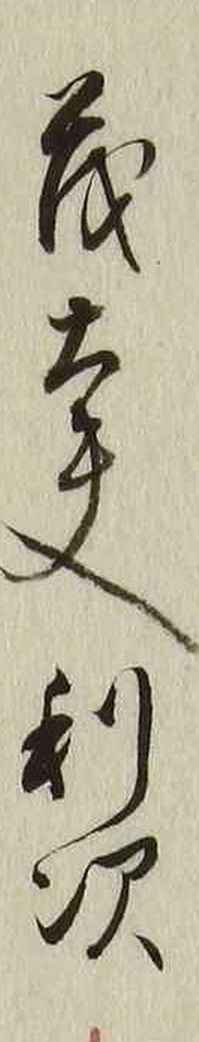茂大夫利次
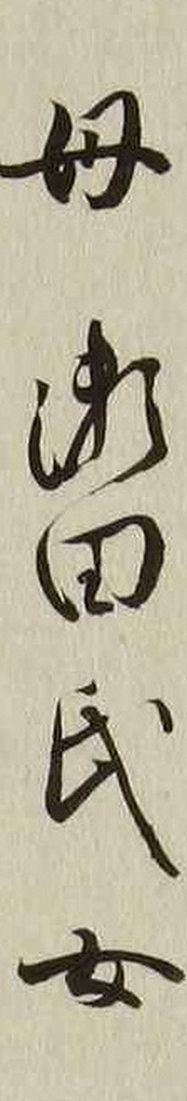母瀬田氏女
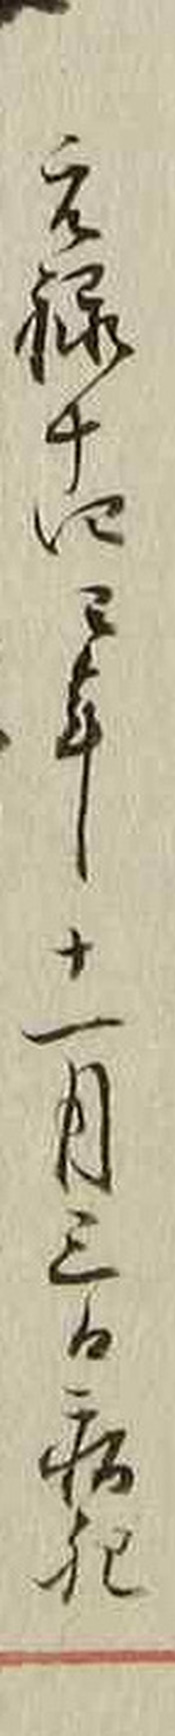元禄十四巳年十一月三日病死
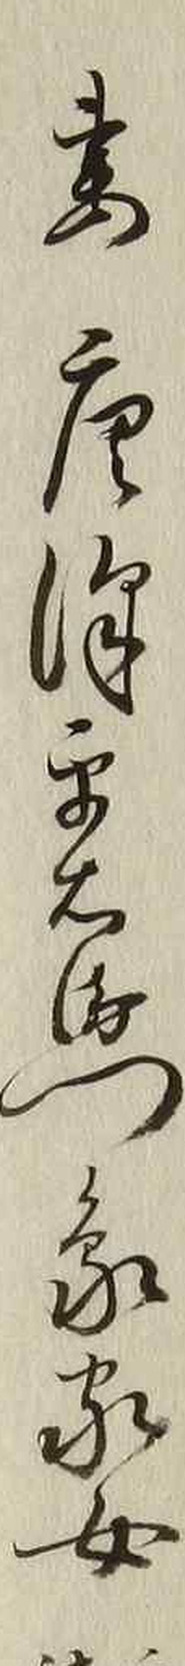妻唐沢平右衛門蒙家女
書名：諸士系譜　巻之20　い之部20
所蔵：会津若松市立会津図書館
